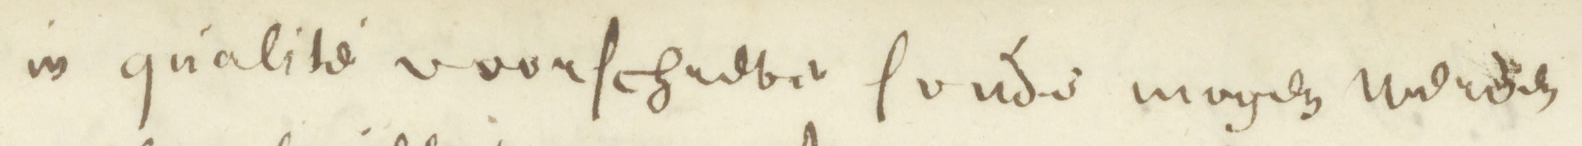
in qualité voorschreve soude mogen werden
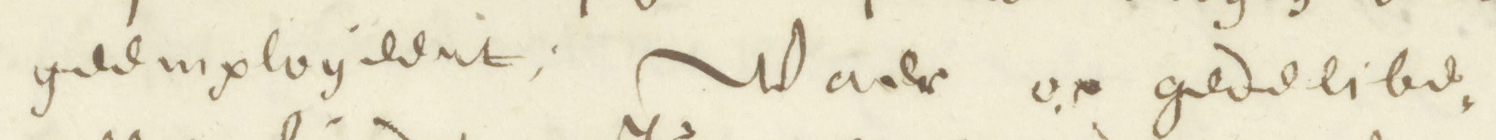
geemploijeert; Waer op gedelibe„
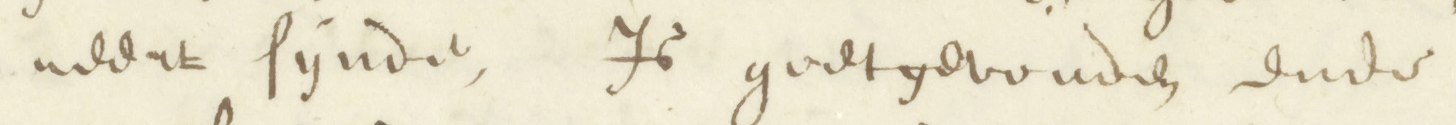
reert sijnde, Is goetgevonden ende
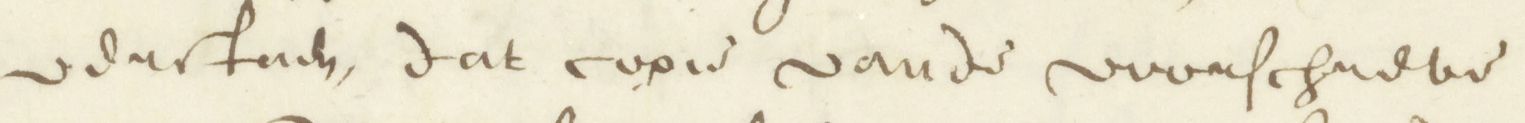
verstaen, dat copie vande voorschreve
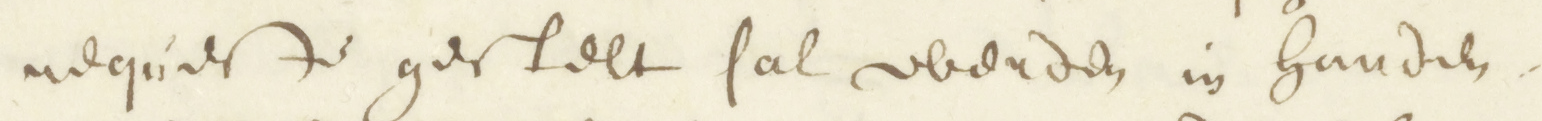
requeste gestelt sal werden in handen
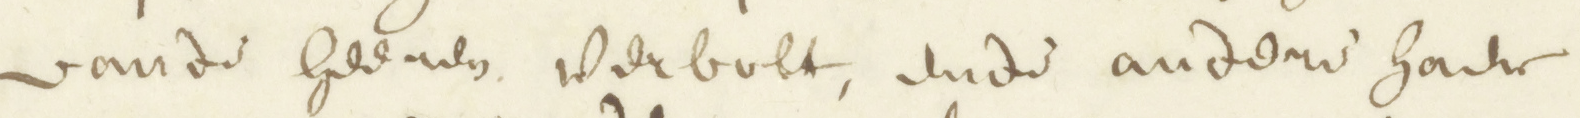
vande heeren Verbolt, ende andere haer
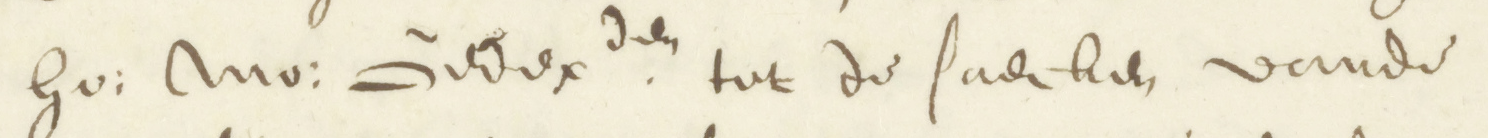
ho:mo: Gedepden. tot de saecken vande
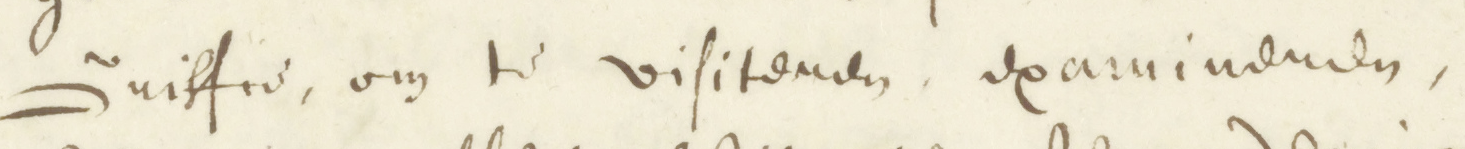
Griffie, om te visiteren, examineren,
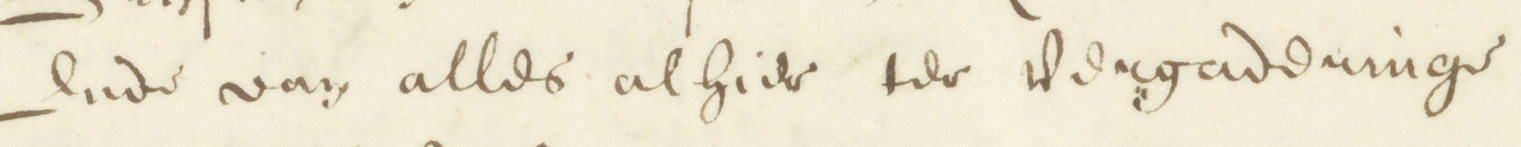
ende van alles alhier ter Vergaderinge
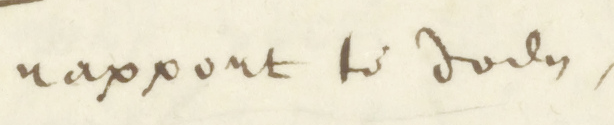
rapport te doen.
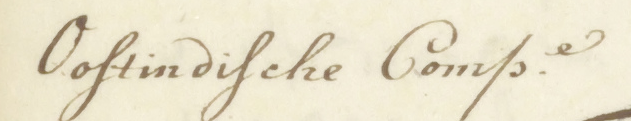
Ooftindische Compe.
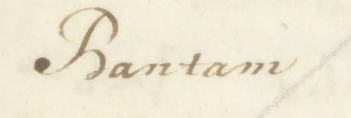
Bantam
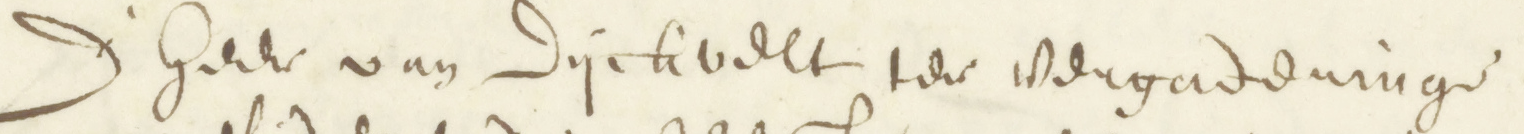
D'heer van Dijckvelt ter Vergaderinge
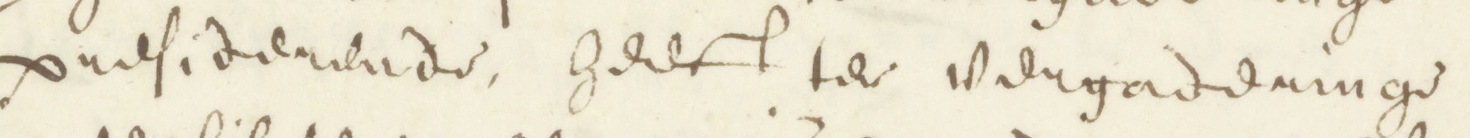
presiderende, heeft ter Vergaderinge
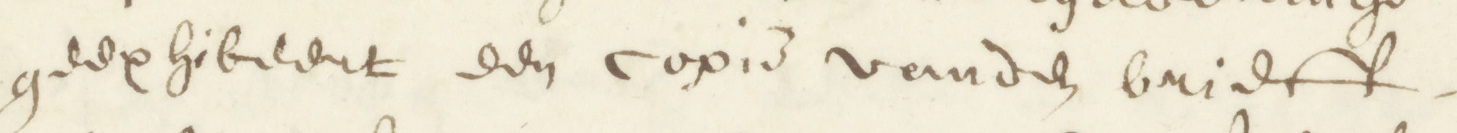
geexhibeert een copie vanden brieff
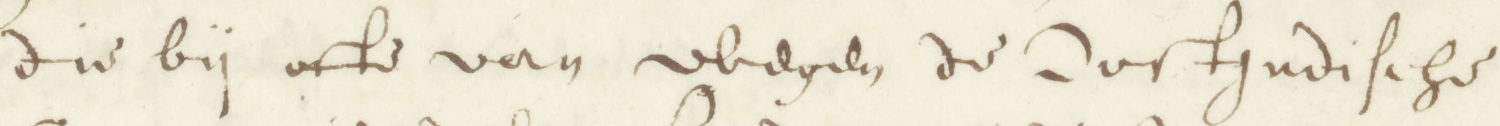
die bij ofte van wegen de Oostindische
